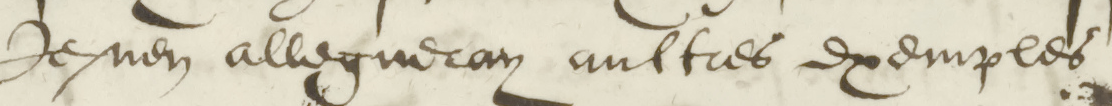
je nen allegueray aultres exemples
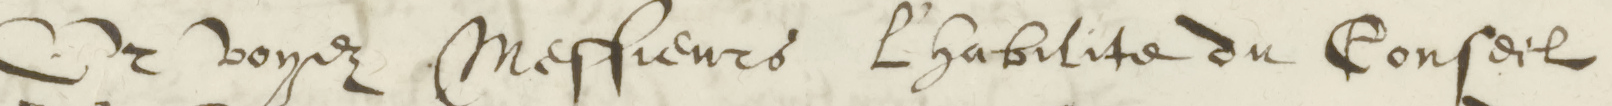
Or voyez messieurs l‛habilite du Conseil
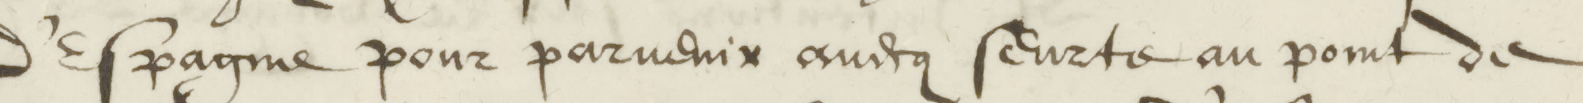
D‛Espagne pour paruenir aueq seurte au point de
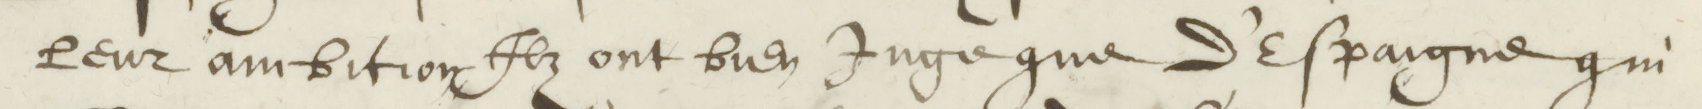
leur ambition Ilz ont bien juge que D‛espaigne qui
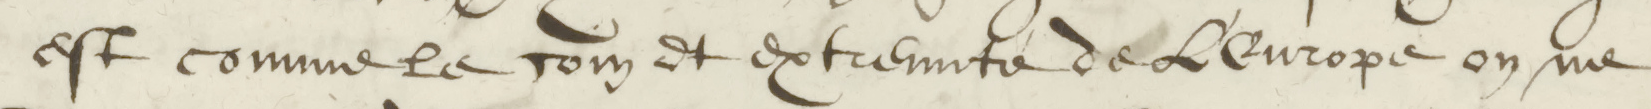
est comme le coin et extremité de L‛Europe on ne
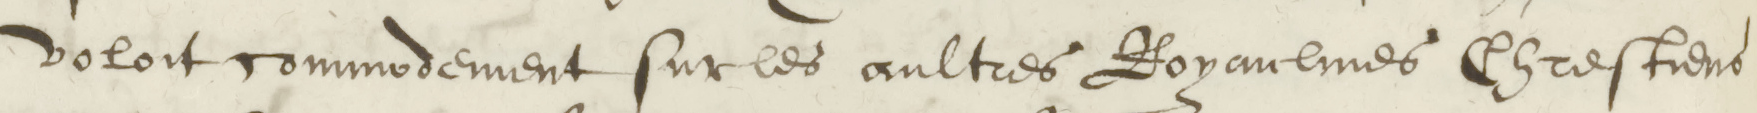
voloit commodement sur les aultres Royaulmes Chrestiens
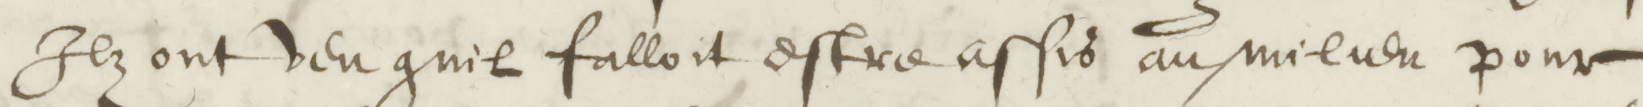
Ilz ont veu quil falloit estre assis au milieu pour
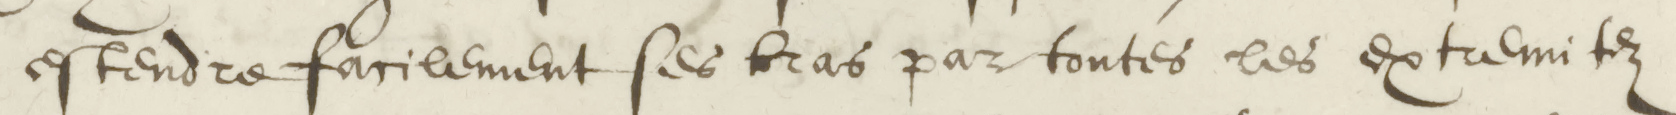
estendre facilement ses bras par toutes les extremitez
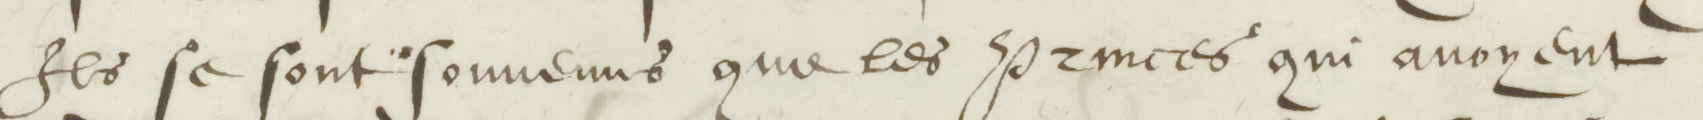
Ils se sont souuenus que les Princes qui auoyent
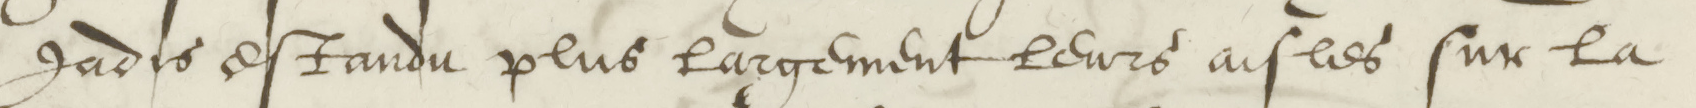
jadis estandu plus largement leurs aisles sur la
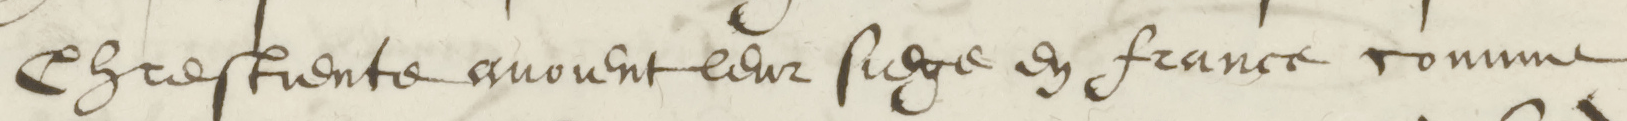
Chrestiente auoient leur siege en france comme
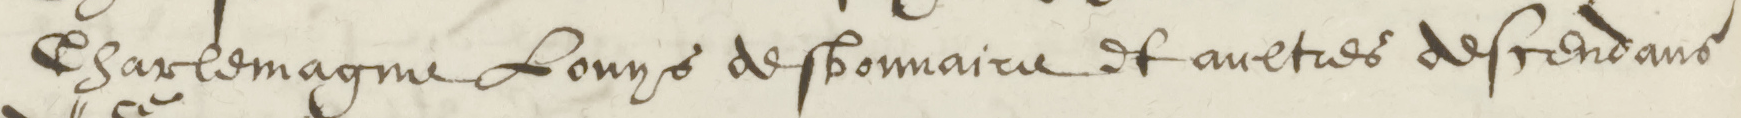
Charlemagne Louys des bonnaire et aultres descendans
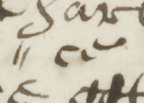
”ce
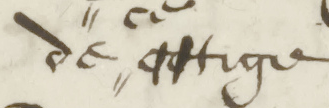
de„ attige
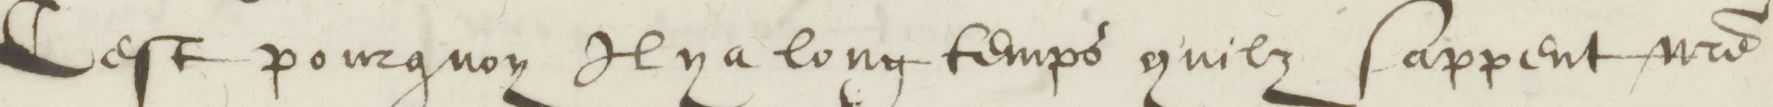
Cest pourquoy il y a long temps q‛uilz sappent nre
